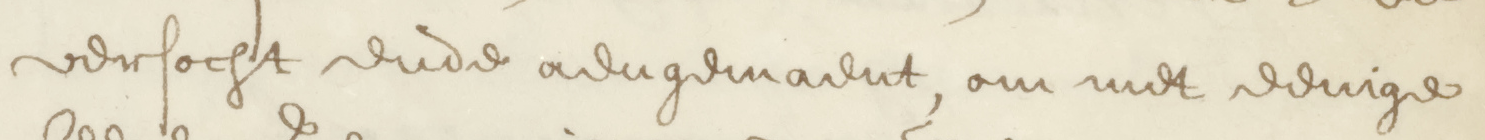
versocht ende aengemaent, om met eenige
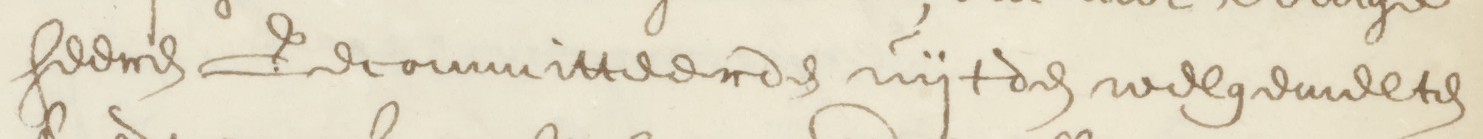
heeren Gecommitteerden uijt den welgemelten
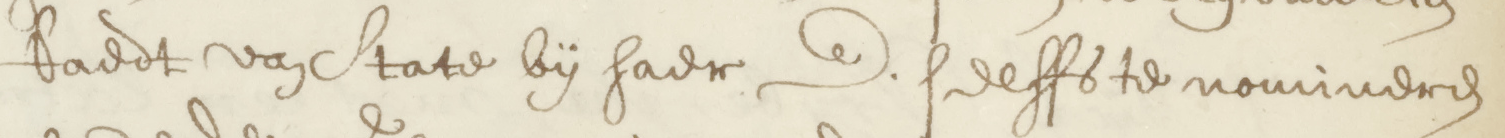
Raedt van State bij haer E. selffs te nomineren
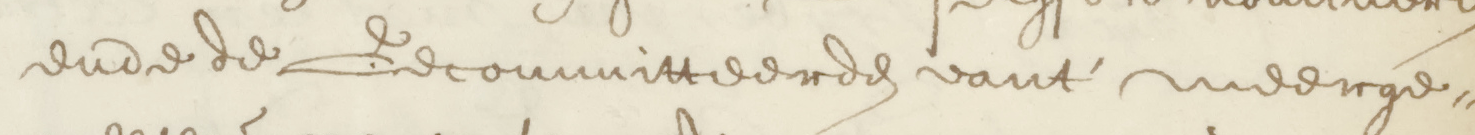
ende de Gecommitteerden vant' meerge„
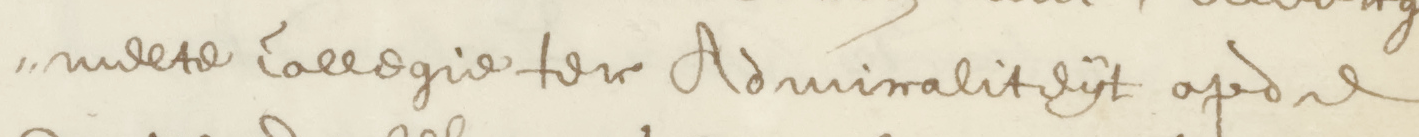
„melte Collegie ter Admiraliteijt opde
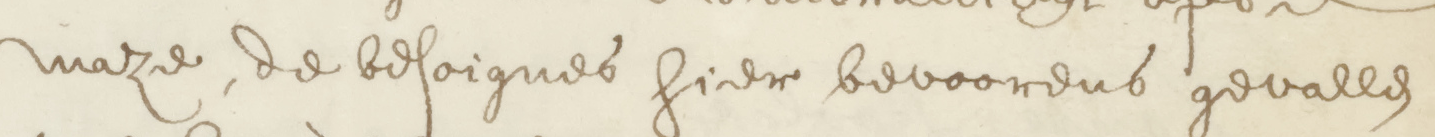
maze, de besoignes hier bevoorens gevallen,
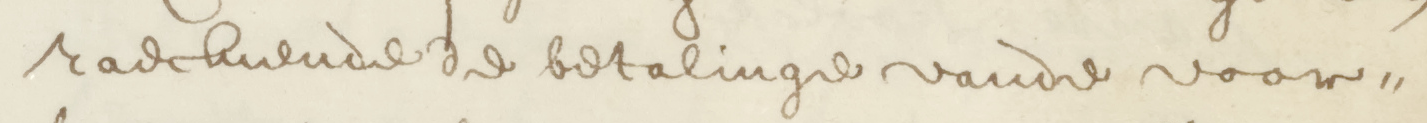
raeckende de betalinge vande voor„
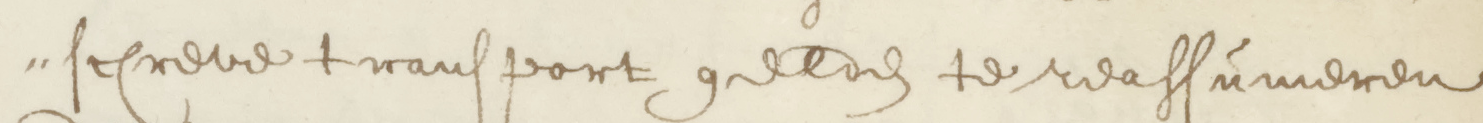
„schreve transport gelden te reassumeren
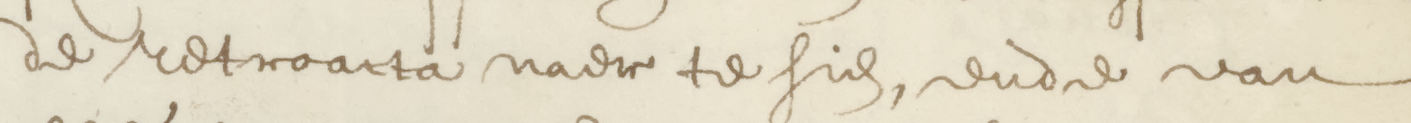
de retroacta naer te sien, ende van
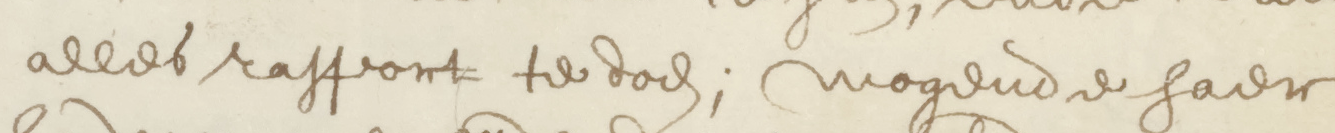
alles rapport te doen; mogende haer
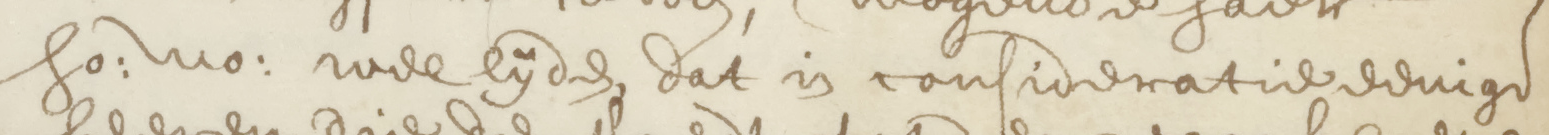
Ho:Mo: wel lijden, dat in consideratie eenige
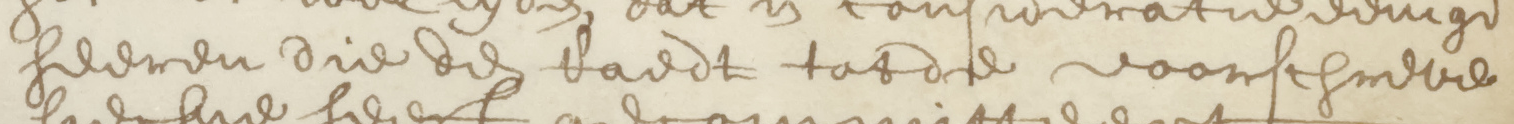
heeren die de Raedt tot de voorschreve
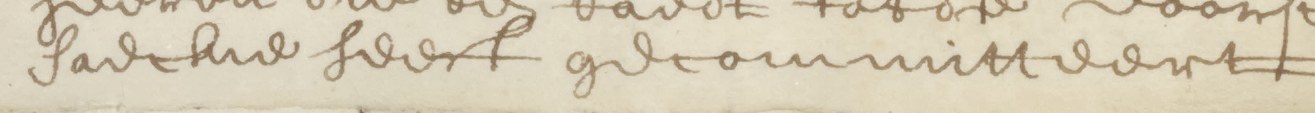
Saecke heeft gecommitteert
